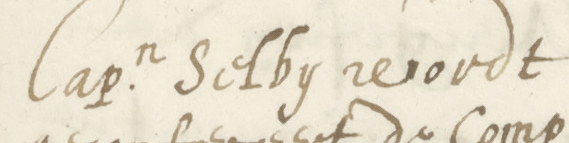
Capn. Selby wordt
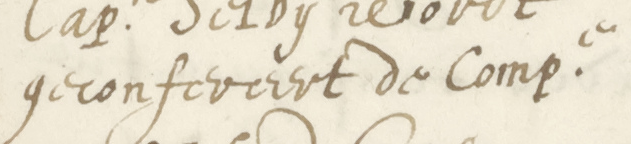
geconfereert de Compe.
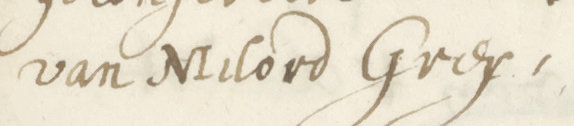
van Milord Grey.
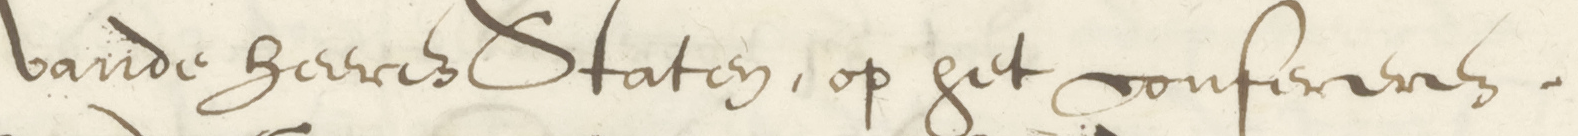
vande heeren Staten, op het confereren
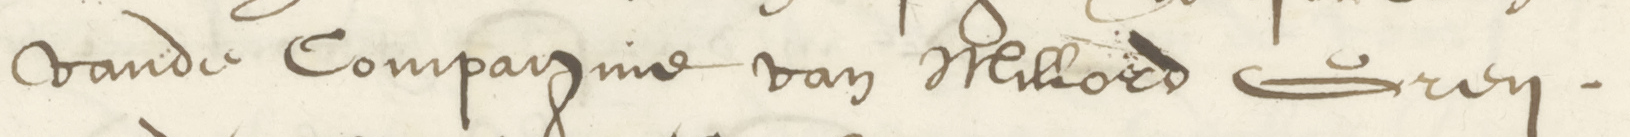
vande Compaignie van Millord Grey -
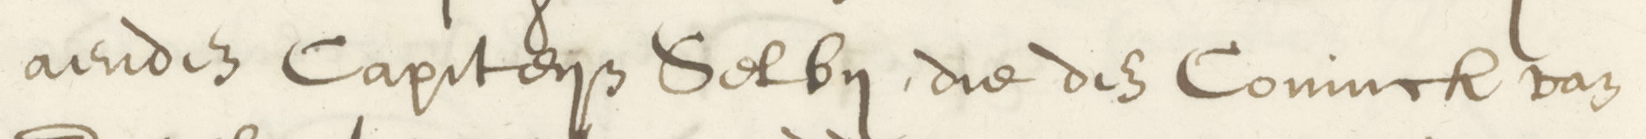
aenden Capiteyn Selby, die den Coninck van
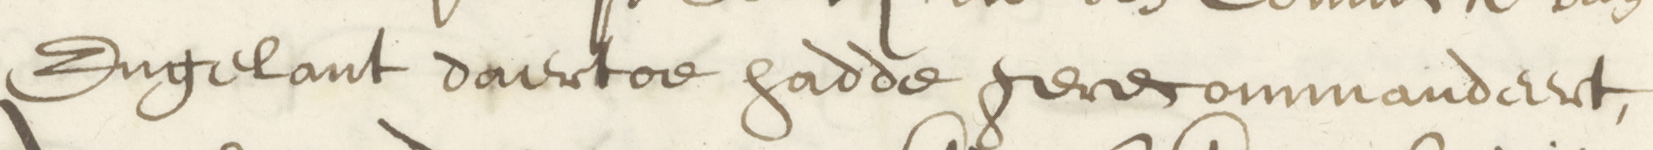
Engelant daertoe hadde gerecommandeert,
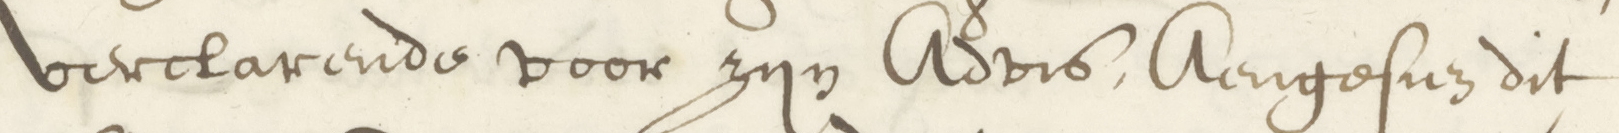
verclarende voor zijn advis, aengesien dit
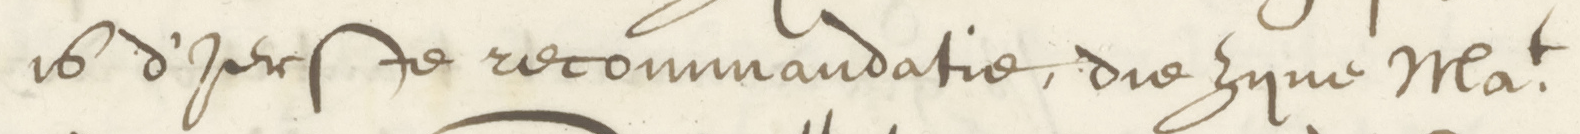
is d'Ierste recommandatie, die zyne Mat.
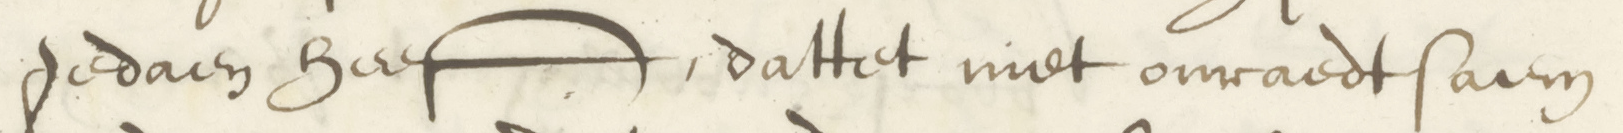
gedaen heeft, dattet niet omraedtsaem
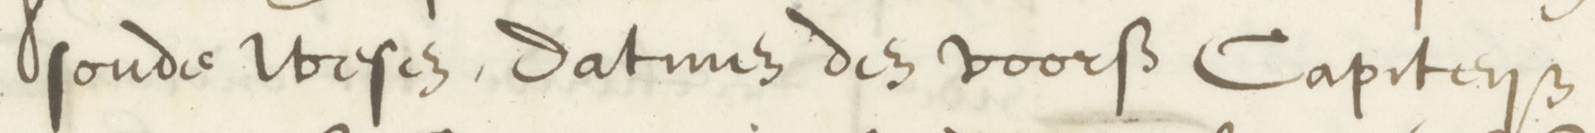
soude wesen, datmen den voors Capiteyn
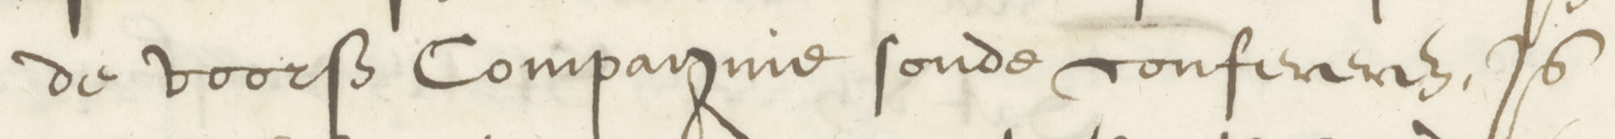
de voors Compaignie soude confereren, Is
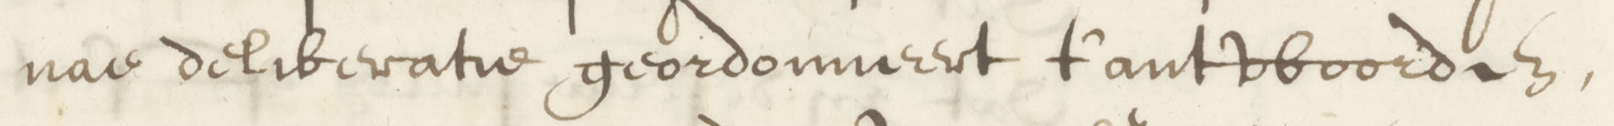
nae deliberatie geordonneert t'antwoorden,
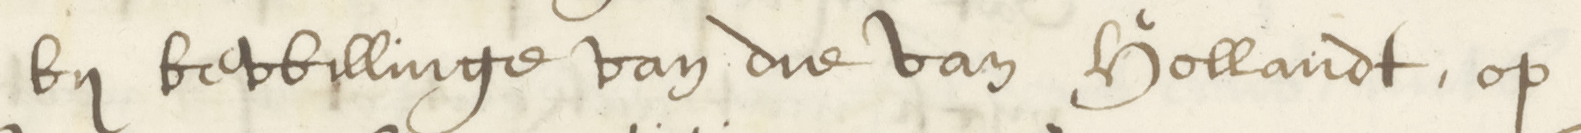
by bewillinge van die van Hollandt, op
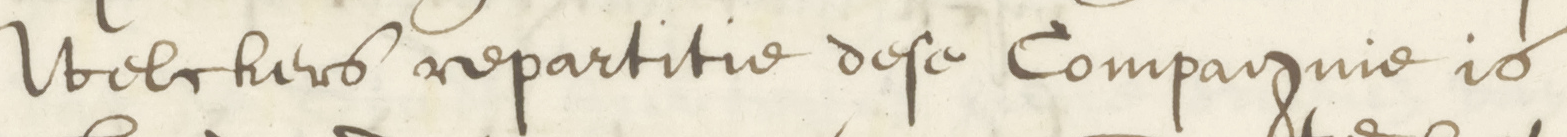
welckers repartitie dese Compaignie is
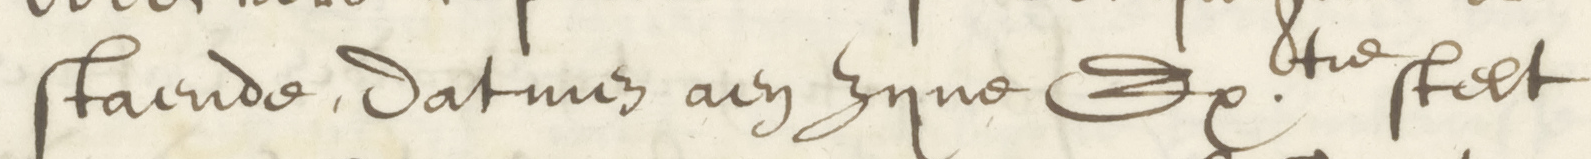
staende, datmen aen zyne Extie stelt
